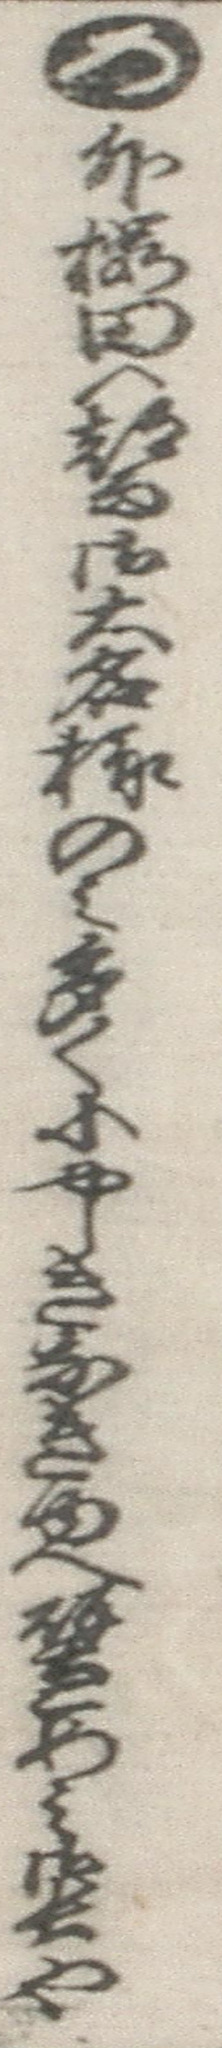ろ外桜田ハ都而御大名様のミ多く小やしきなきゆへ壁あミ之御長や
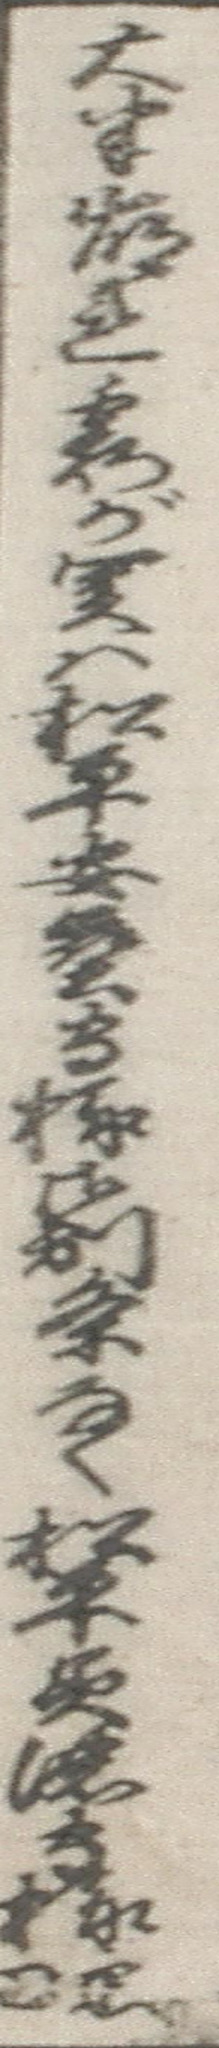大半崩れ霞が関ハ松平安芸守様御別条なく松平美濃守様黒田
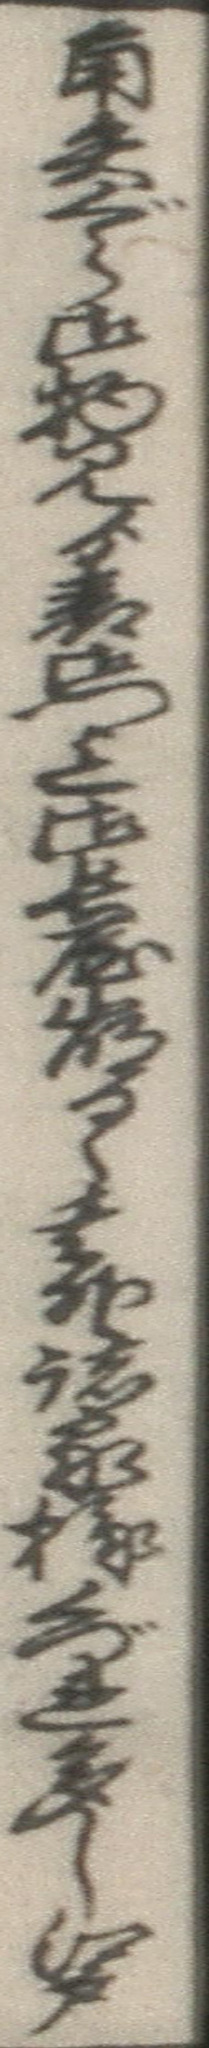角矢ぐら御物見ゟ表御門迄御長屋崩るゝ其外諸家様くづれ多し江戸
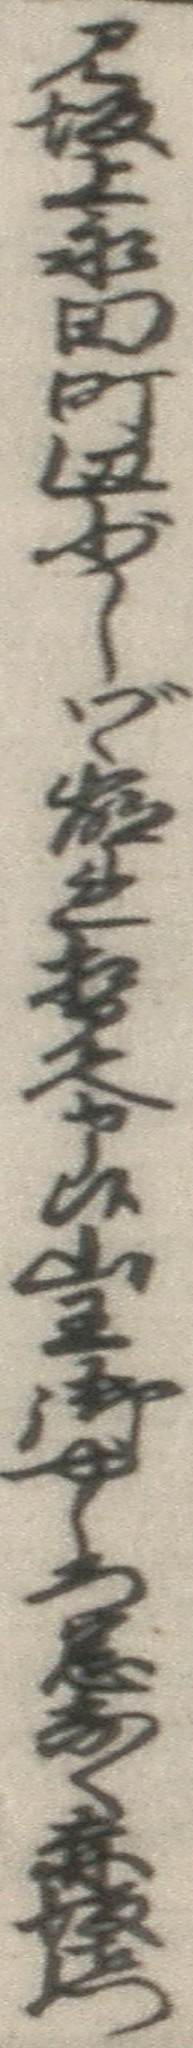見坂上永田町辺少しづゝ崩れ相見へ申候山王御やしろ恙なく赤坂御門
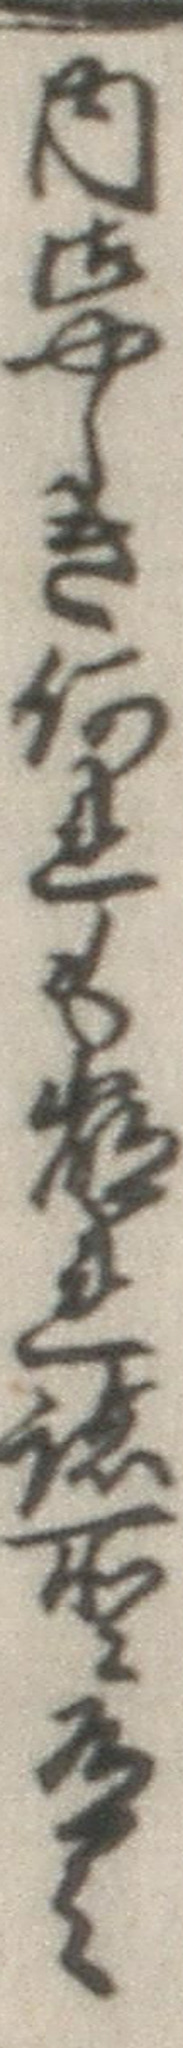内御やしき何れも崩れ諸所ニ有之
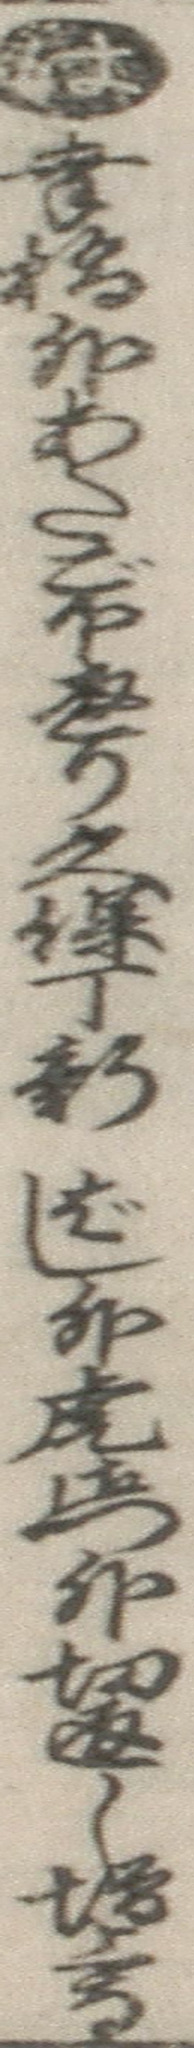は幸橋外あたご下通り久保丁新ばし外虎御門外切通し増上寺
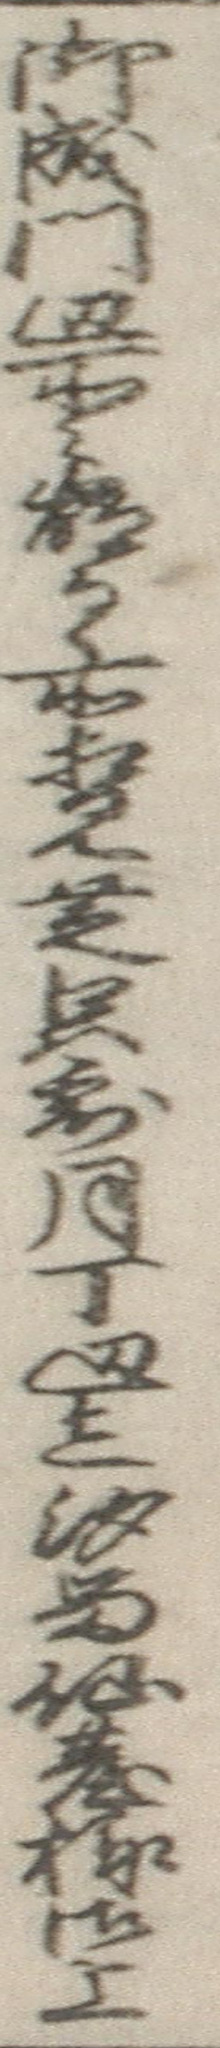御成門辺所々崩るゝ所相見芝口ハ露月丁辺迄汐留仙台様御上
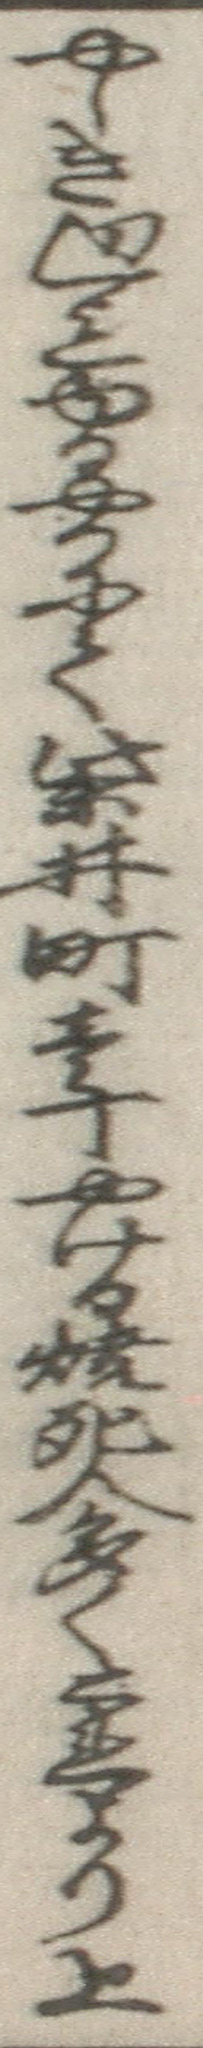やしき辺迄ゆるやかにて柴井町壱丁やける焼死人多くこれより上
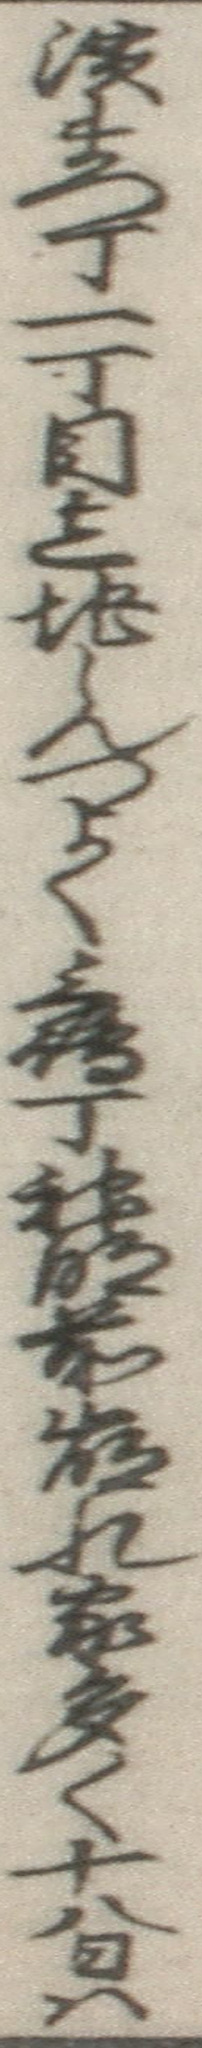浜まつ丁一丁目迄地しんつよく三島丁神明前崩れ家多く十八日ハ
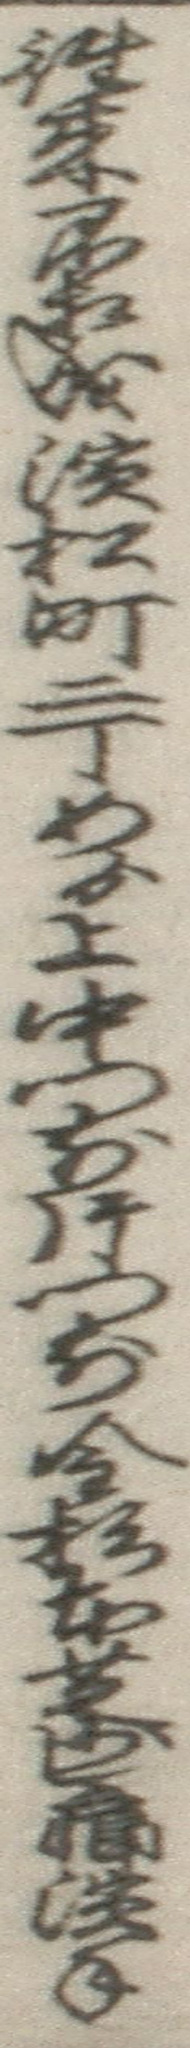往来不相成浜松町二丁めゟ上中門前片門前金杉本芝少し痛浜手
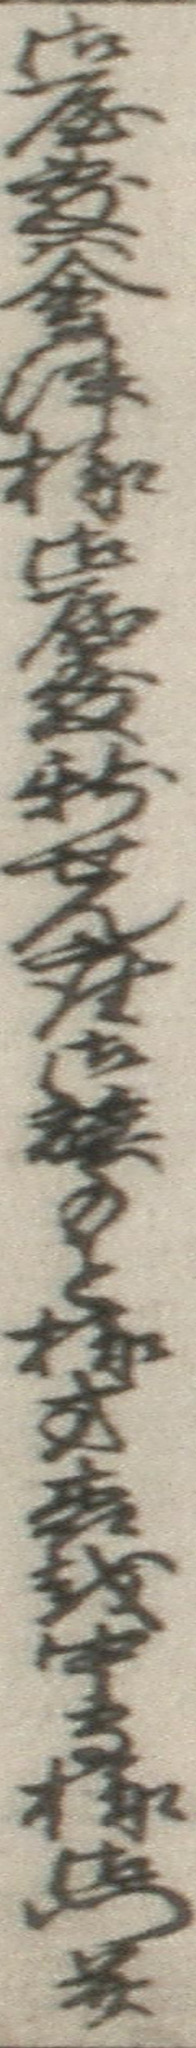御屋敷ハ会津様御屋敷新せん座御旗もと様方森越中守様御門幷
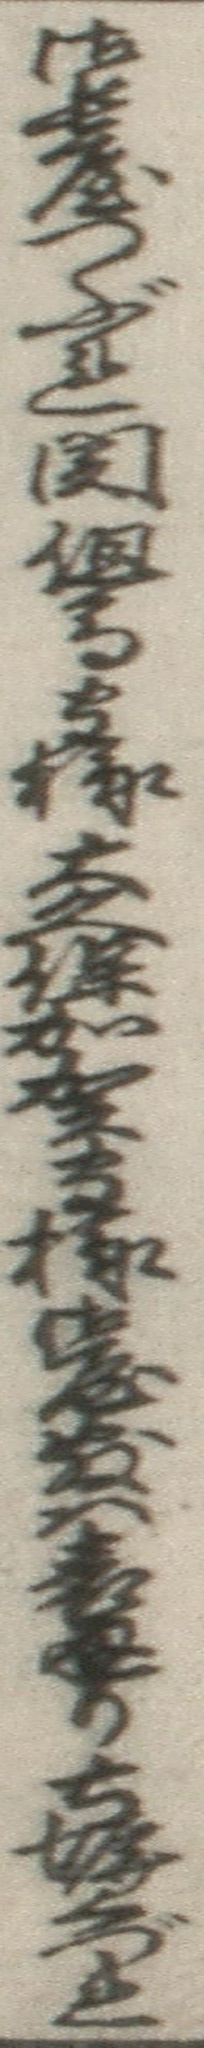御長屋つぶれ関但馬守様大久保加賀守様御屋敷ハ表通り土塀くづれ

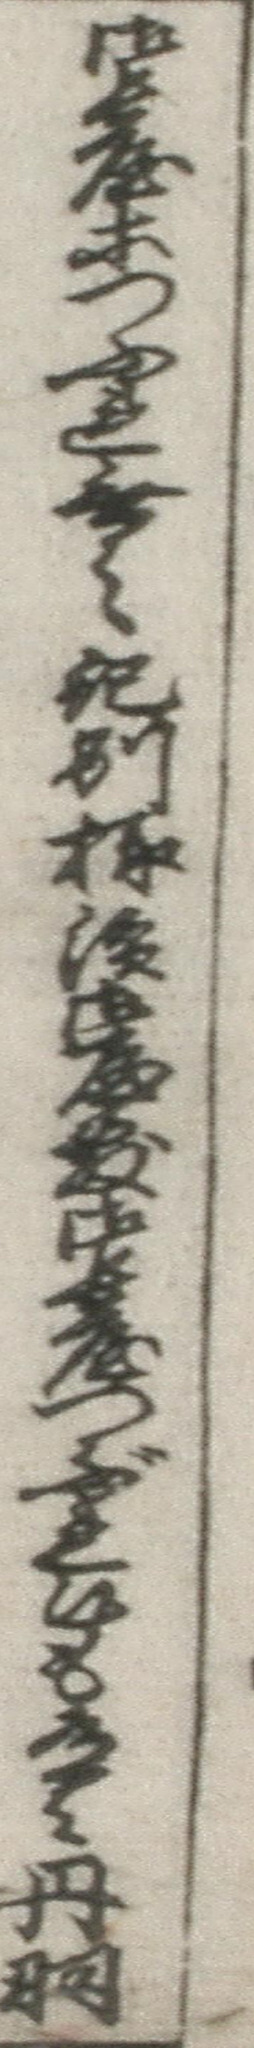御長屋等つふれ無之紀州様浜御屋敷御長屋つぶれ候も有之丹羽
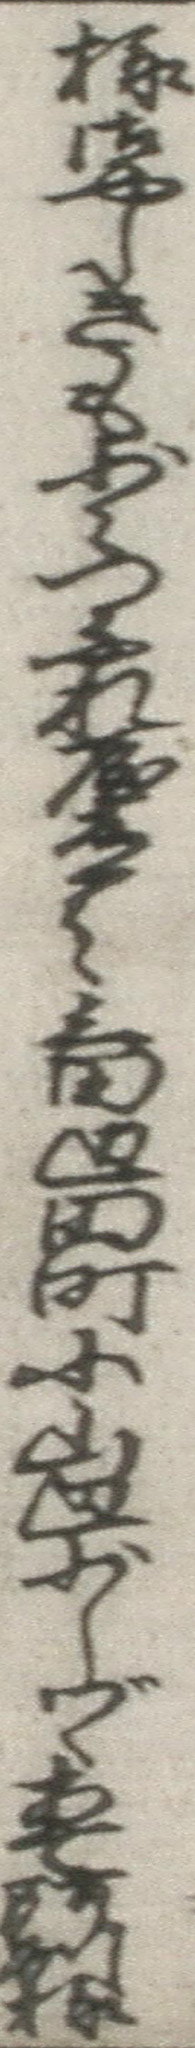様御やしきも少々つふれ屋有之三田辺田町小山辺少しづゝにて防州様
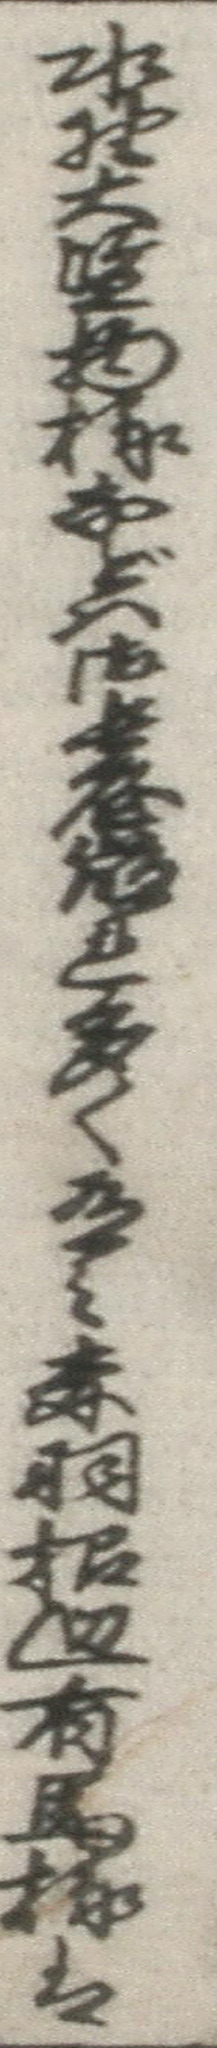水野大監物様などハ御長屋崩れ多く有之赤羽根辺有馬様は
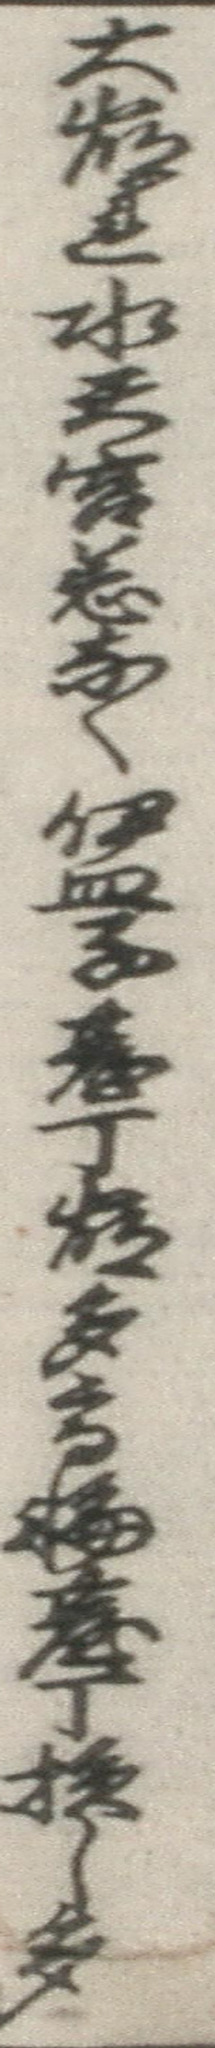大崩れ水天宮恙なく伊皿子台丁崩多高輪台丁損し多
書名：大地震焼場細見記
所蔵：東京大学地震研究所図書室 Earthquake Research Institute Library, The University of Tokyo, JAPAN
